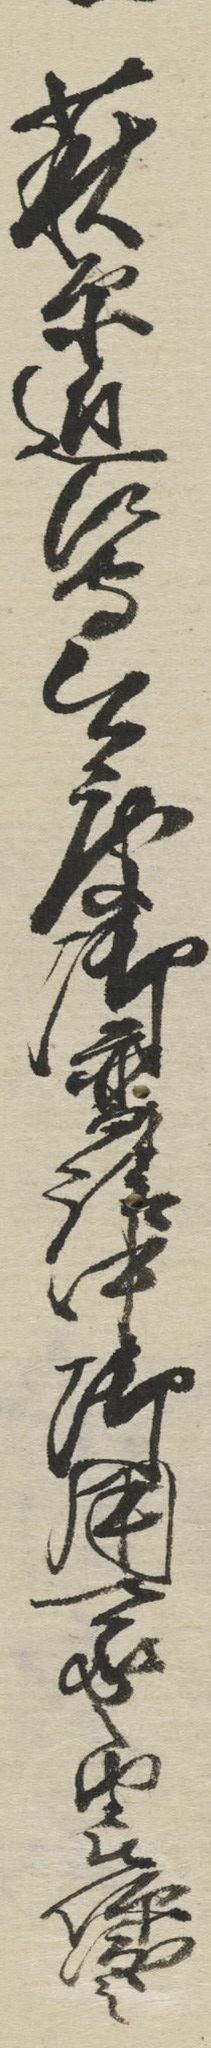一荻原近江守今度御普請中御用可承之由被仰渡之
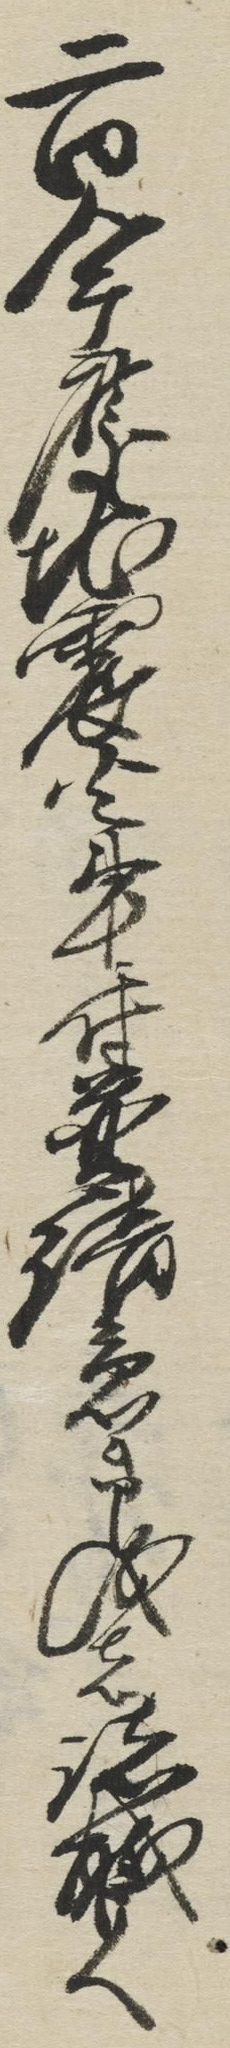二日今度地震火事二付普請急き儀は諸職人
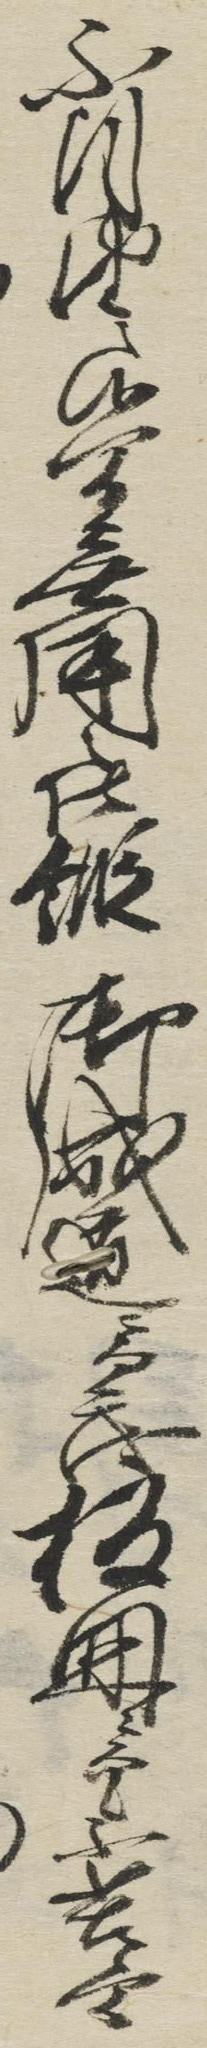不行届二候間無用二仕候縦御成道二而も板囲ひ二而も不苦候間
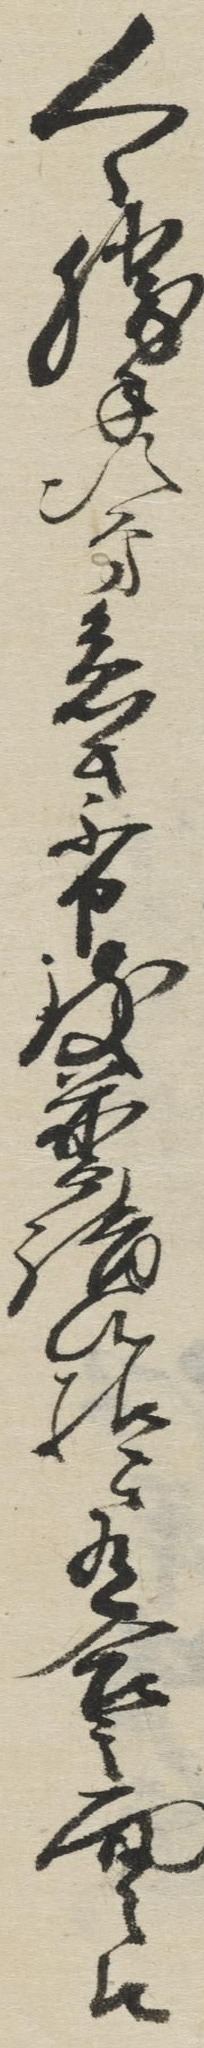人々勝手次第急き不申致普請候様と有合之面々江
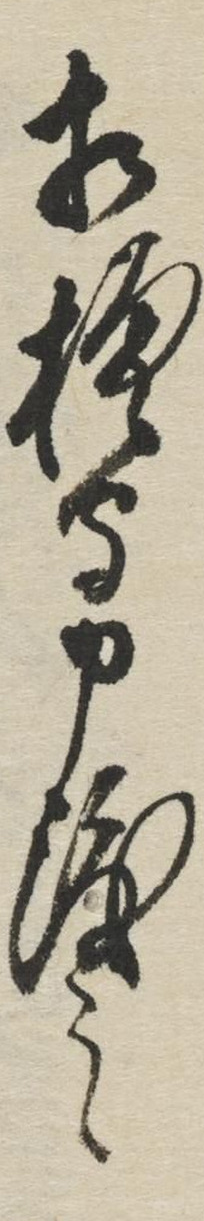相模守申渡之
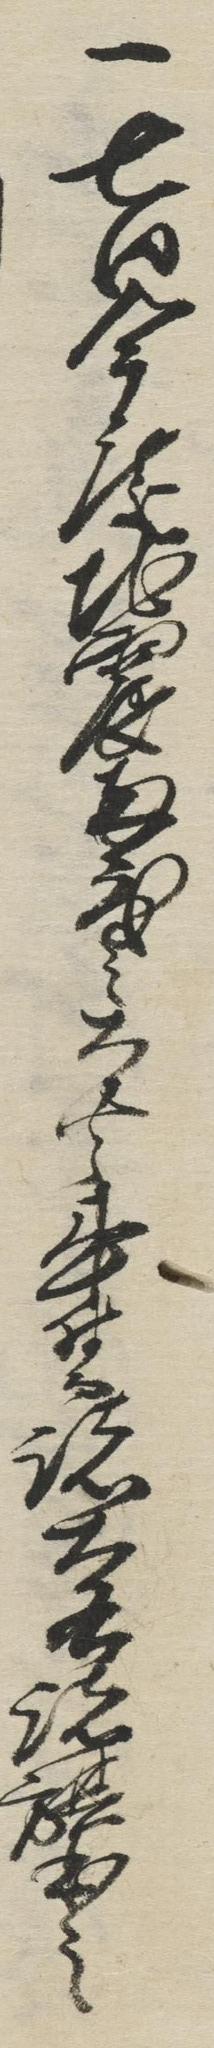一七日今度地震両度之大火事付而諸大名諸旗本之
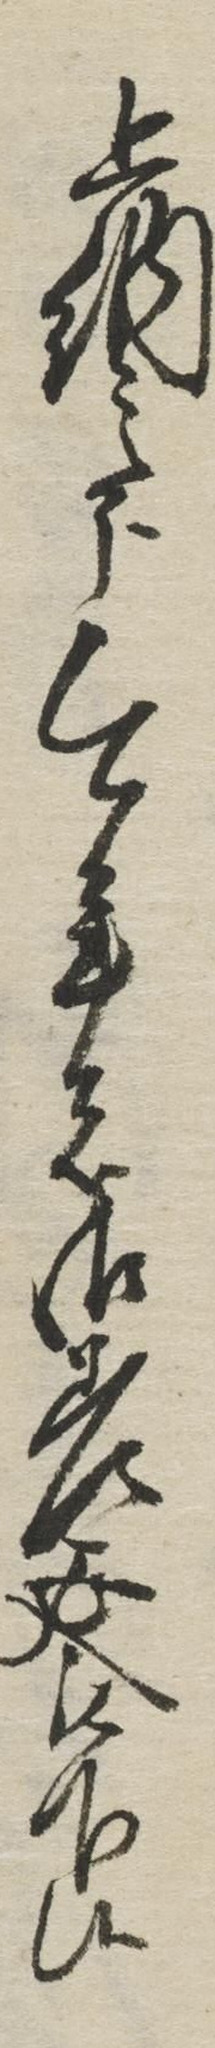上納之分今年は御差延被下候
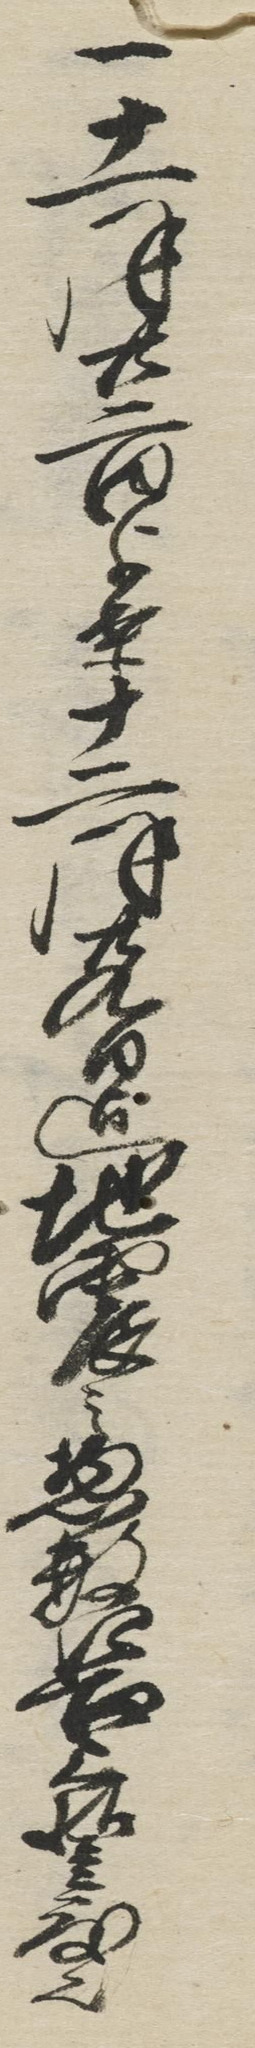一十一月廿二日より十二月廿九日迄地震之惣数四百三拾壱度也
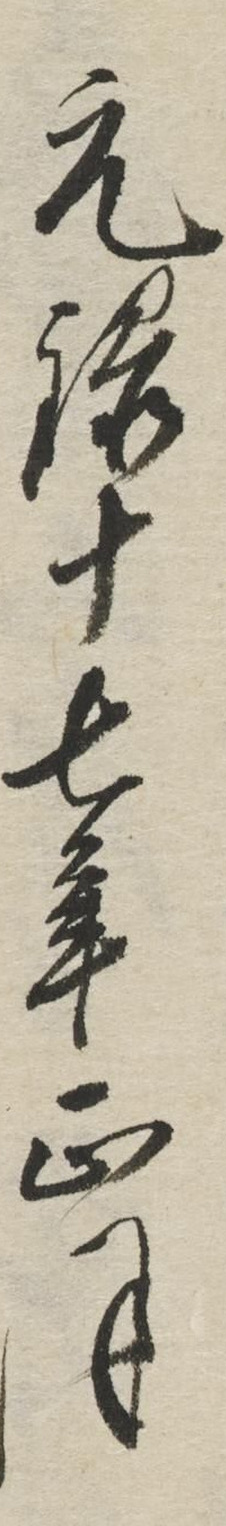元禄十七年正月
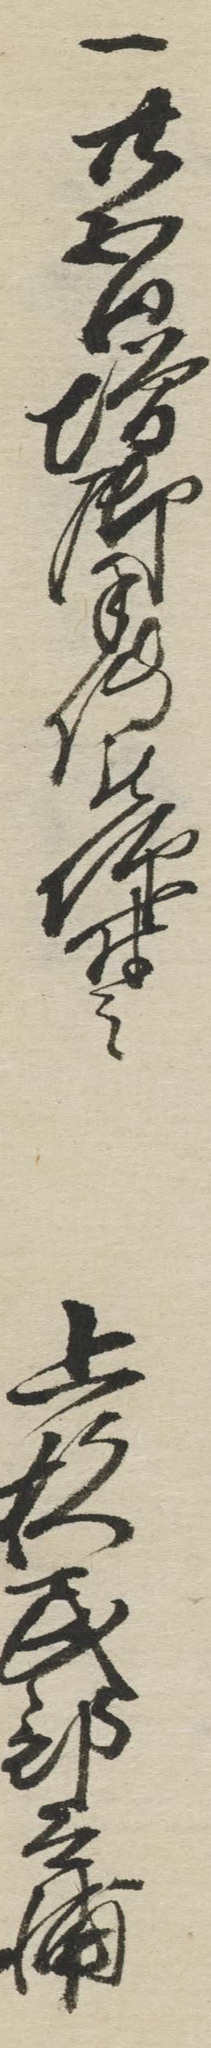一廿五日増御手伝被仰付之上杉民部太輔
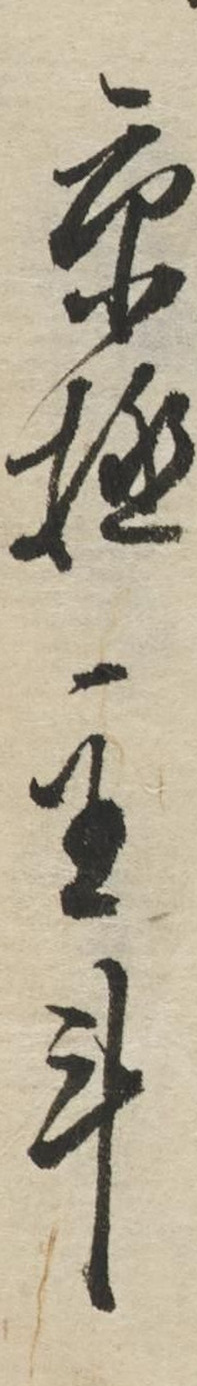京極主計

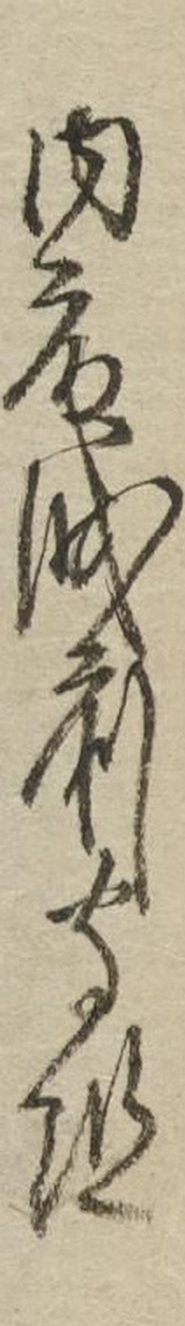内藤越前守組
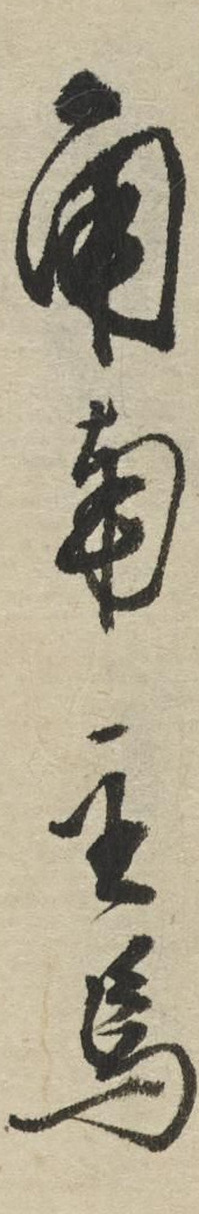角南主馬
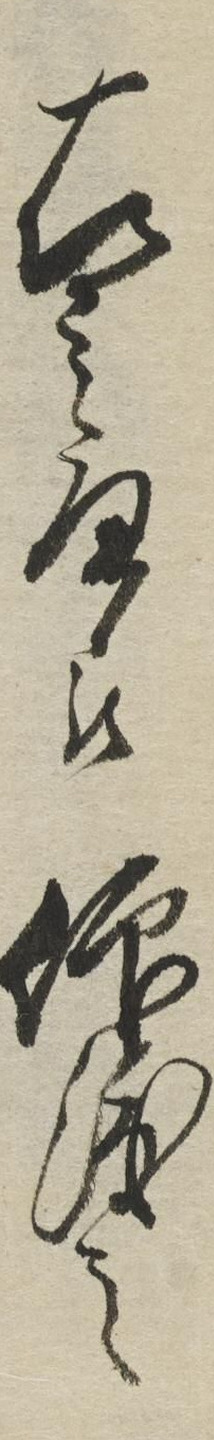右之通被仰渡之
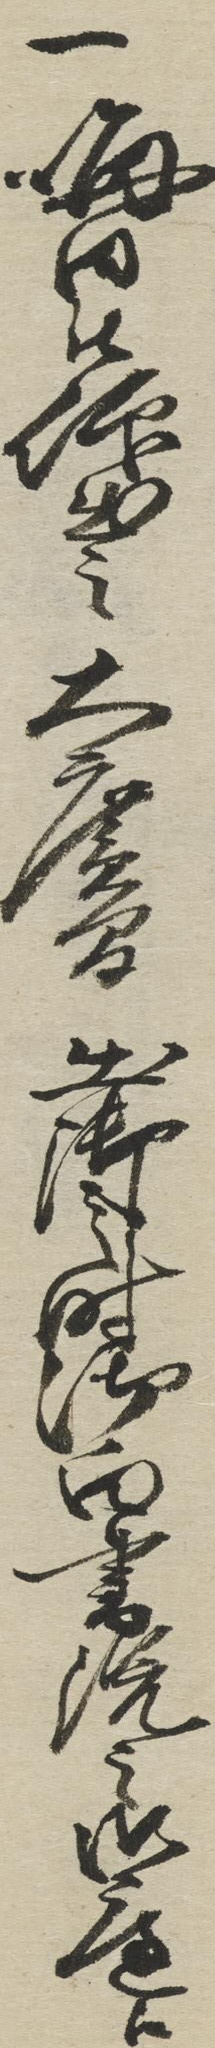一晦日被仰出之大広間出御之時御白書院之御庭江
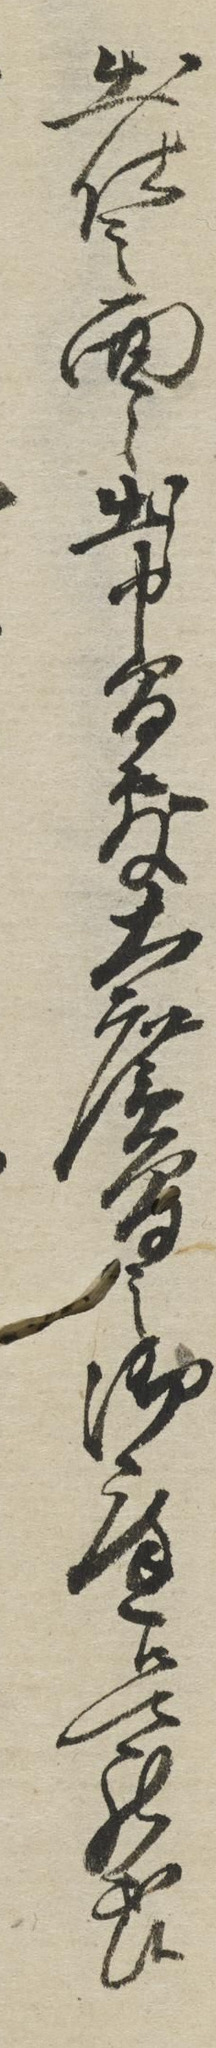出仕之面々出申間敷大広間之御庭江可罷出候
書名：元禄地震記
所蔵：東京大学地震研究所図書室 Earthquake Research Institute Library, The University of Tokyo, JAPAN
